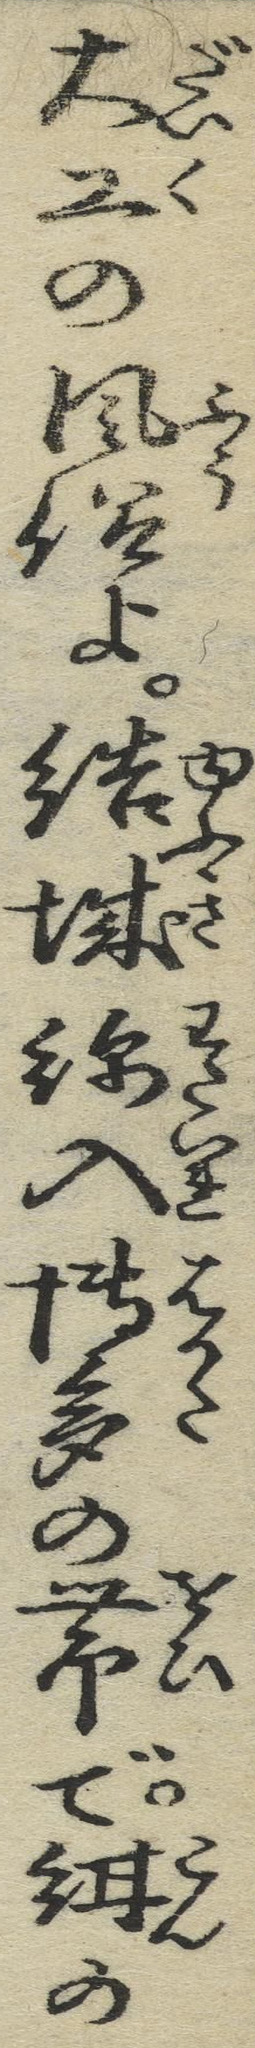大工の風俗よ。結城綿入博多の帯で。紺の
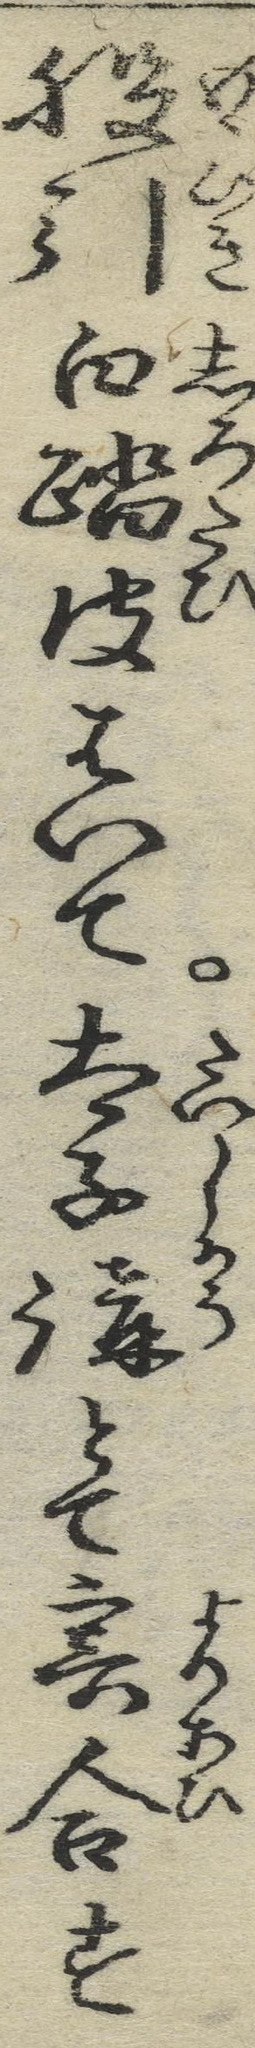股引白踏皮はいて。太子講とて寄合す
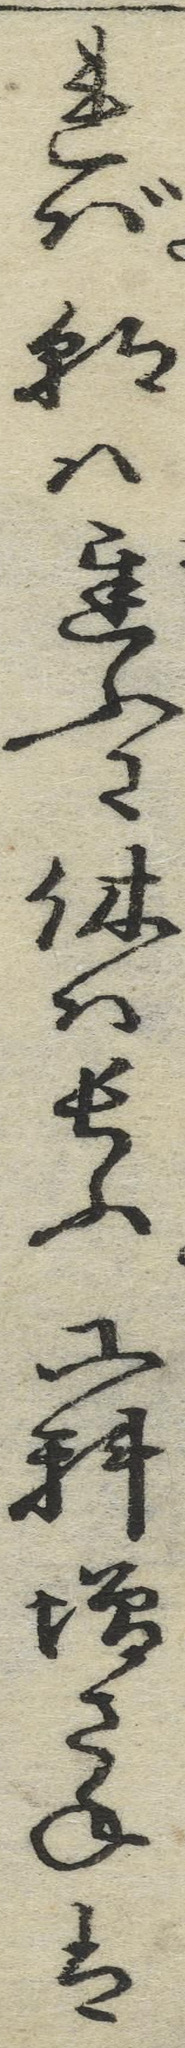れば。朝は遅ふに休は長ふ。工料増さねは
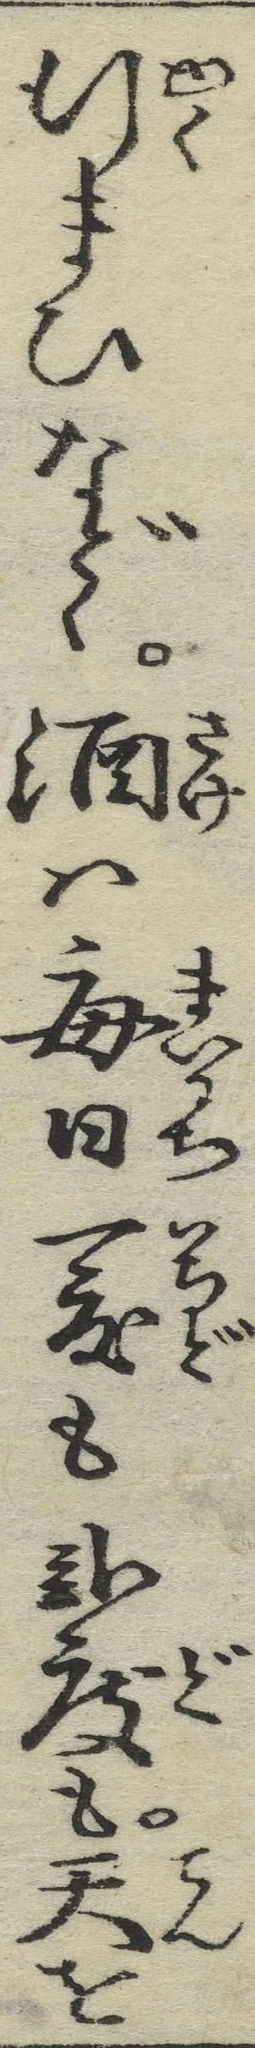行まひなどゝ。酒は毎日一度も弐度も天を
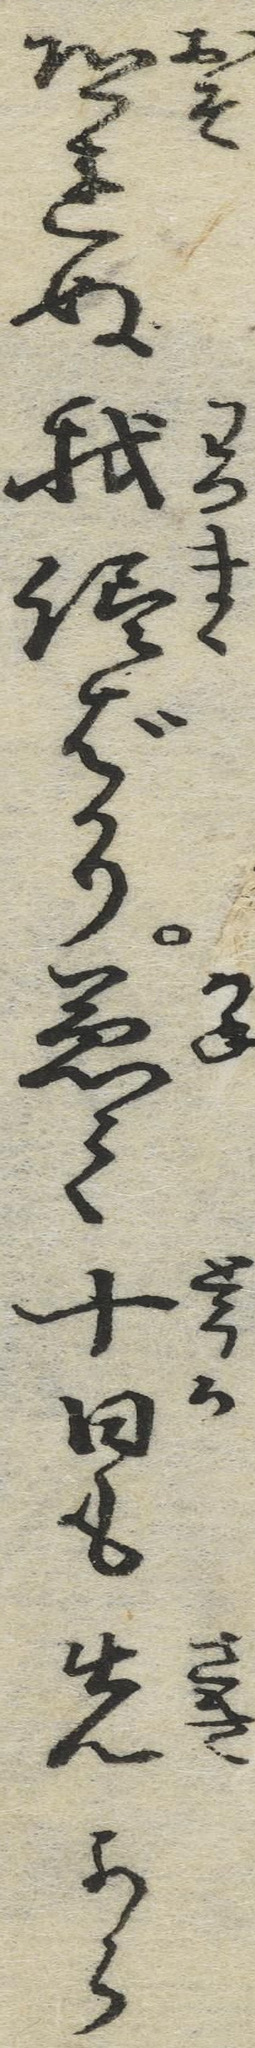恐れぬ我儘ばかり。兼て十日も先から
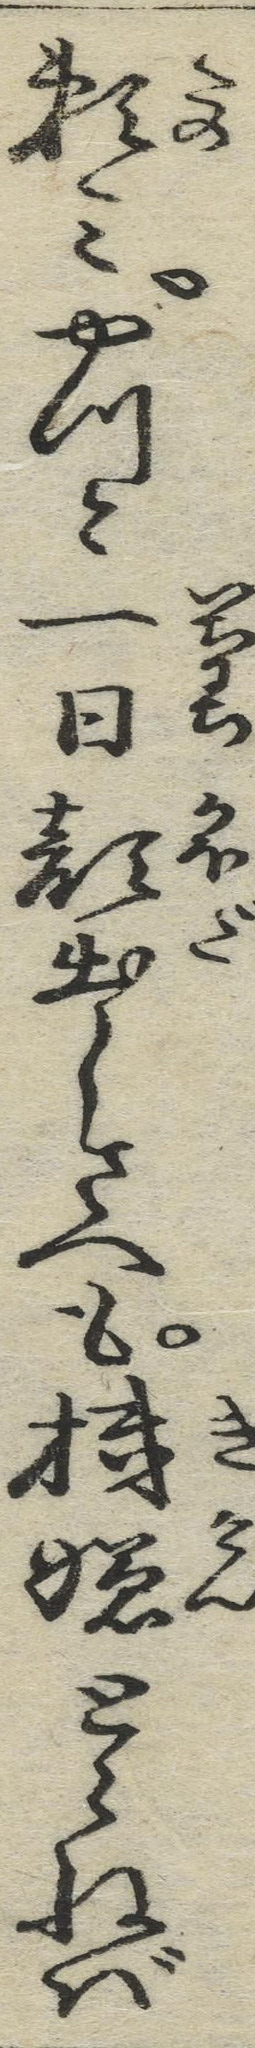頼み。やつと一日顔出しさへも。機嫌とらねば
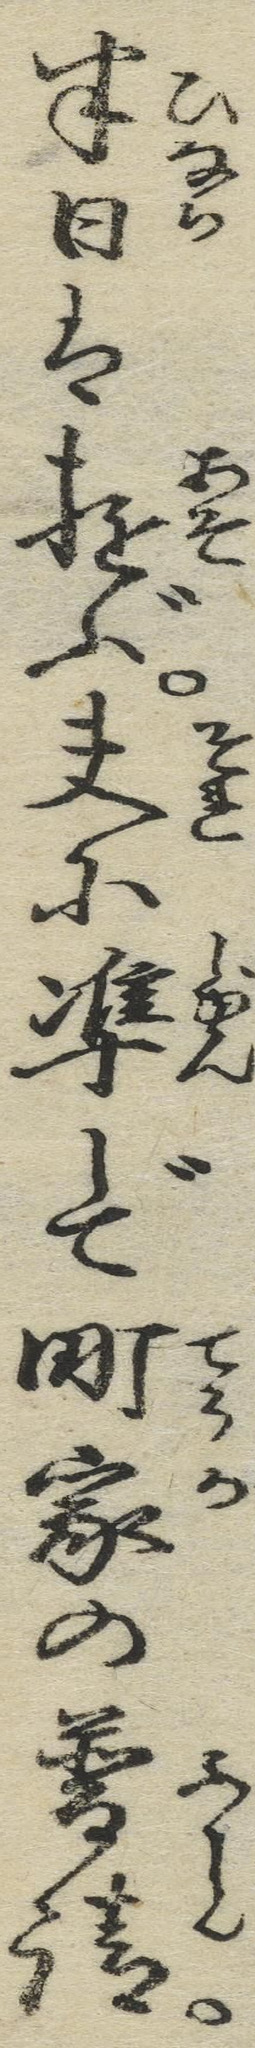半日は遊ぶ。夫に準じて町家の普請。
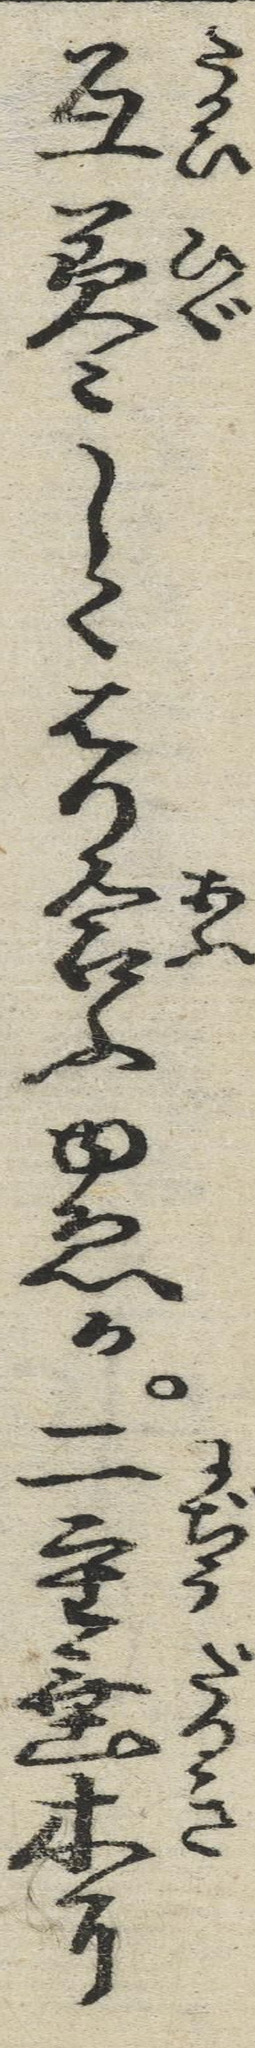互美ゝしくはり合ふゆゑか。二重垂木に
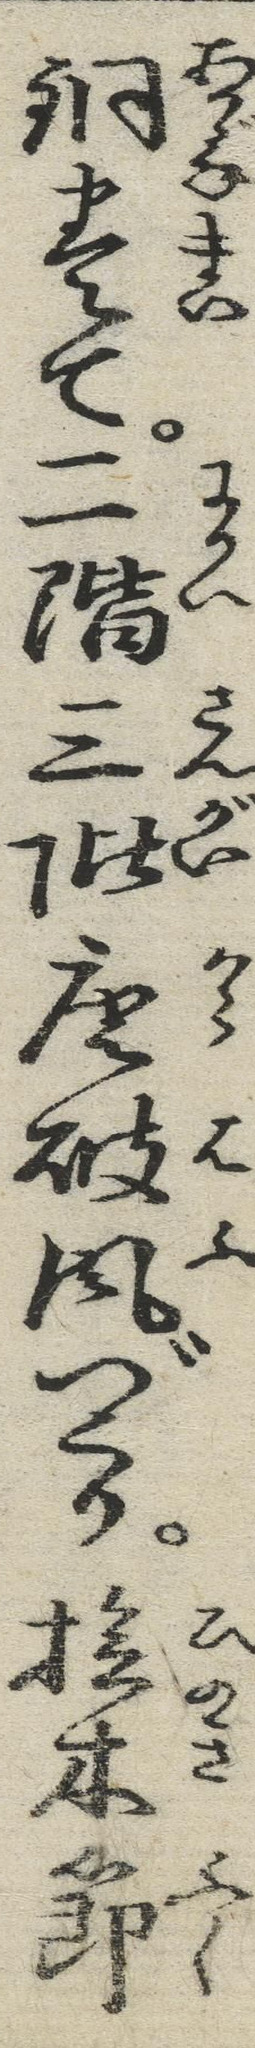銅巻て。二階三階唐破風づくり。桧木節
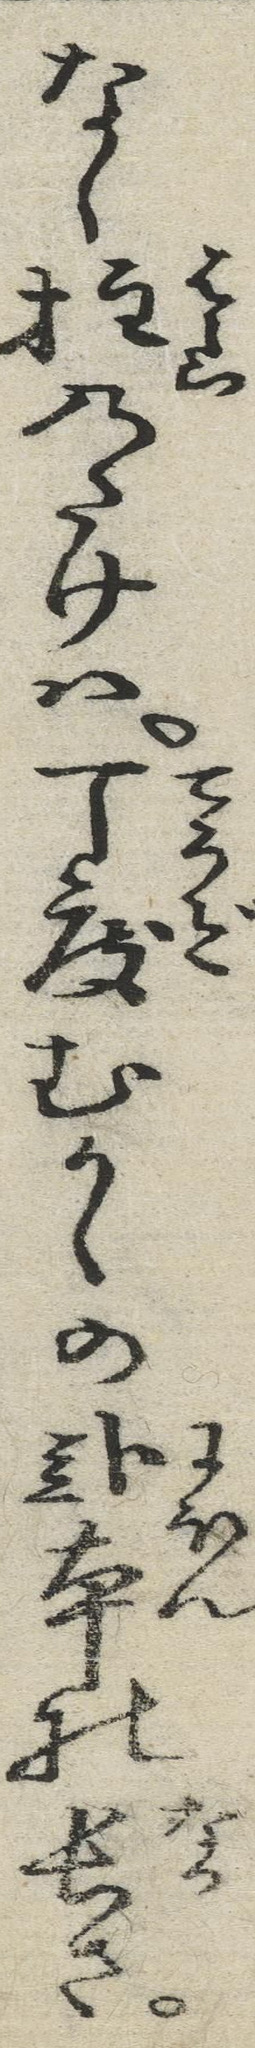なく柱のたけは。丁度むかしの弐本の長さ。
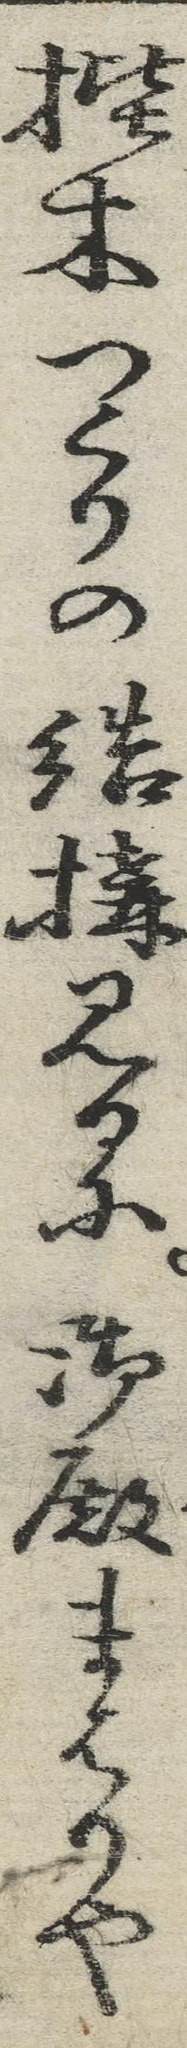堅木つくりの結構見るに。御殿まはりや
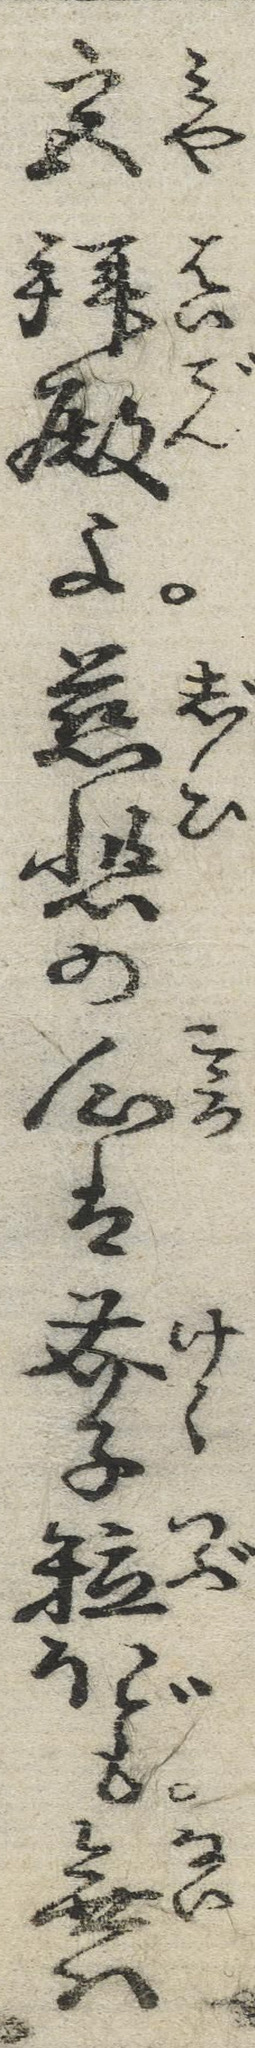宮拝殿に。慈悲の心は芥子粒ほども無は
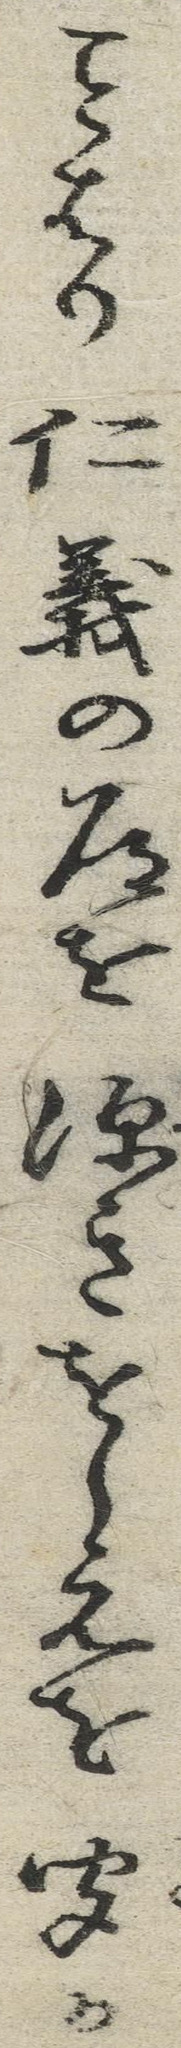ことはり仁義の道を深きをしえを聞か
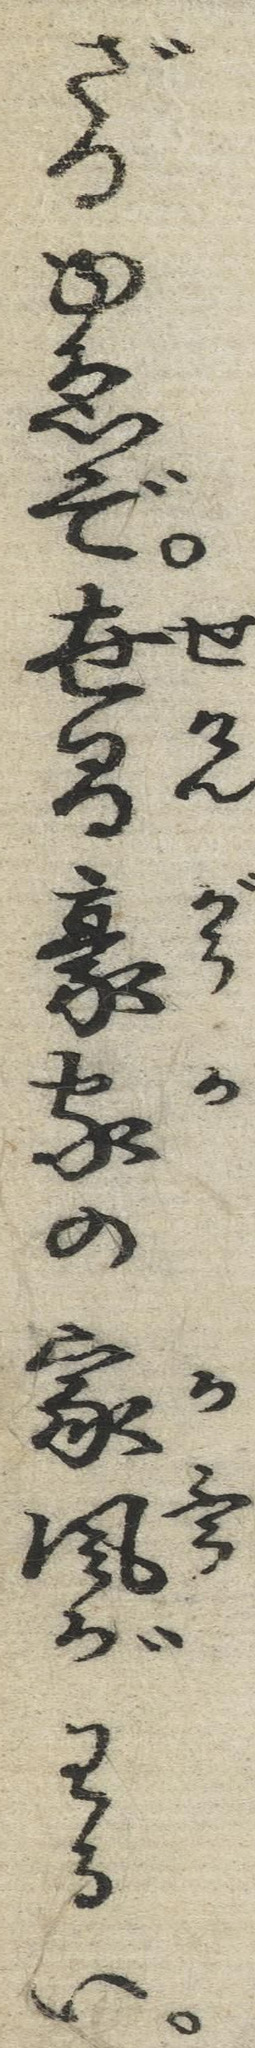ざるゆゑぞ。世間豪家の家風がわるい。

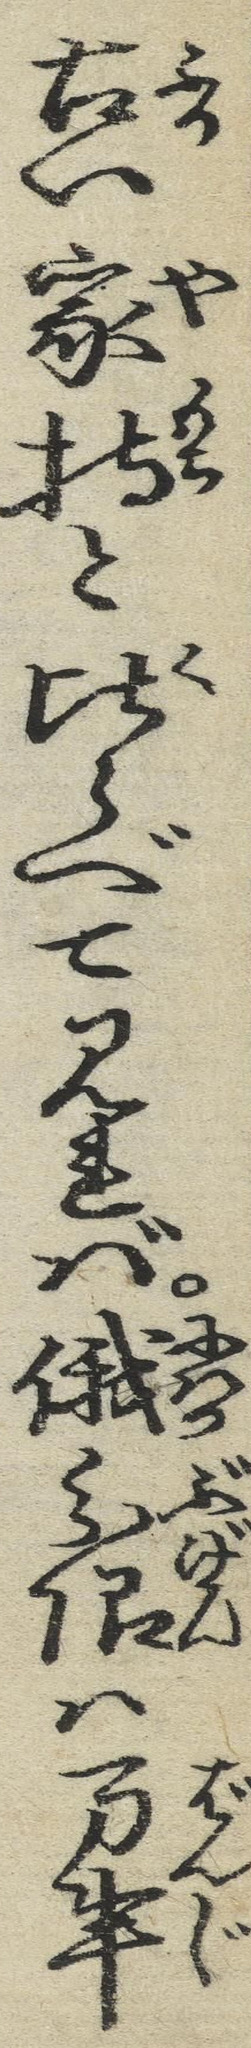古い家持と比らべて見れば。俄分限は万事
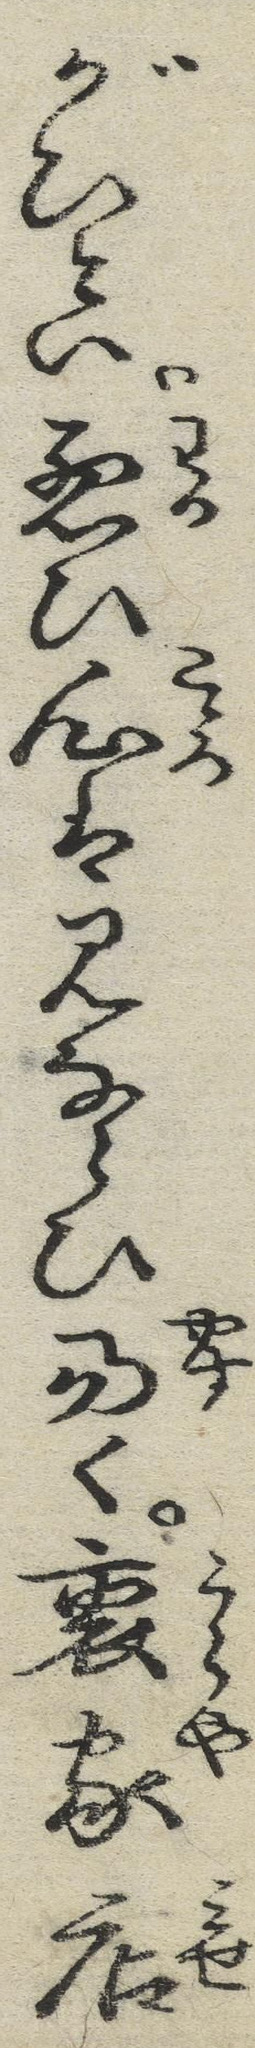がひとい。悪ひ心は見ならひ易く。裏家店
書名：越後地震口説
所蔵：東京大学地震研究所図書室 Earthquake Research Institute Library, The University of Tokyo, JAPAN
